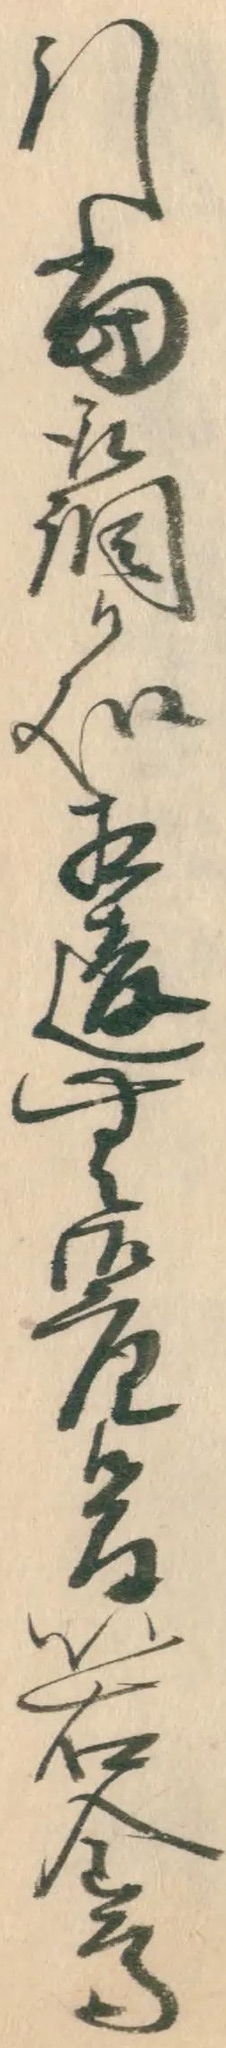引当取調候処相違無御座候間以右金高

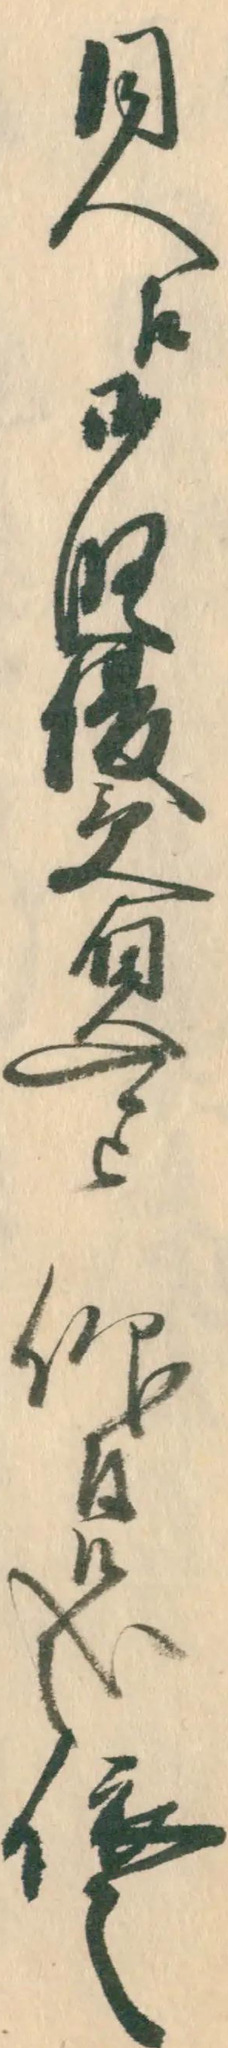同人え御修復受負可被仰付候哉依之
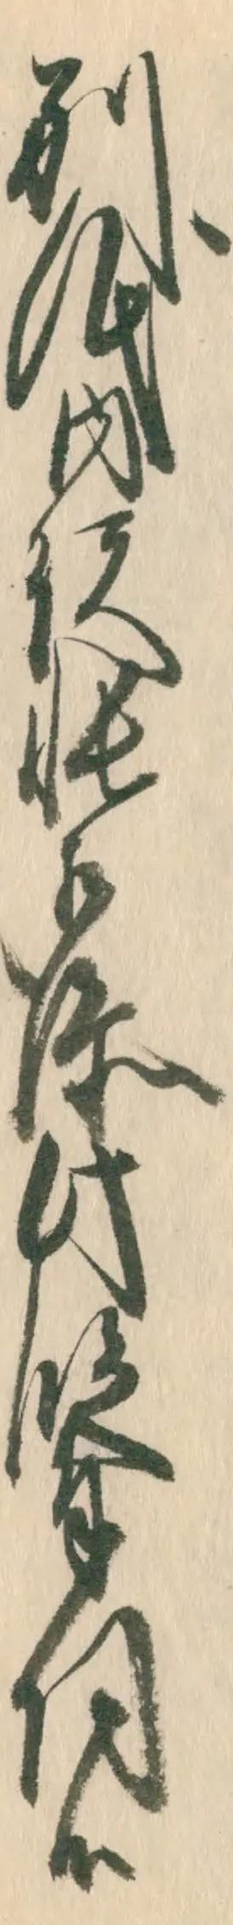別紙内訳帳相添此段奉伺候
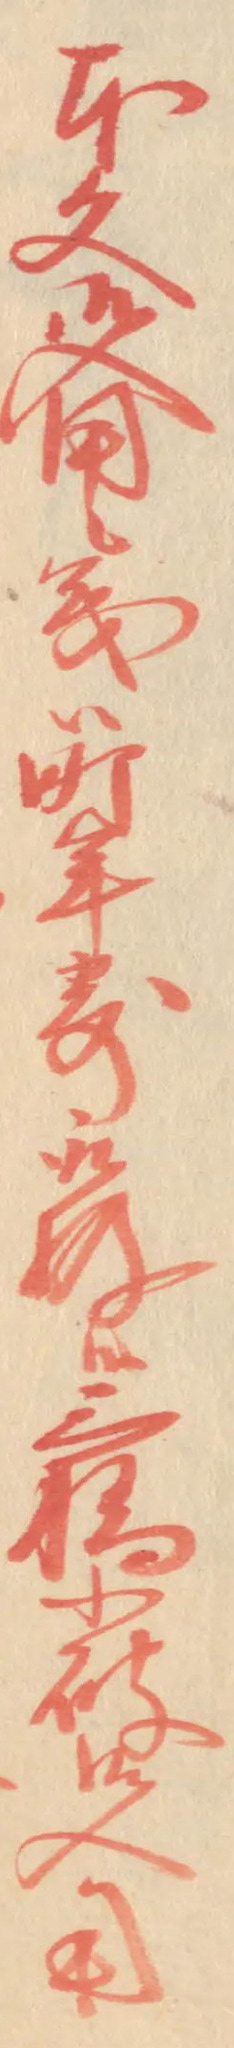本文御入用之義ハ町年寄取扱候三橋小破御入用
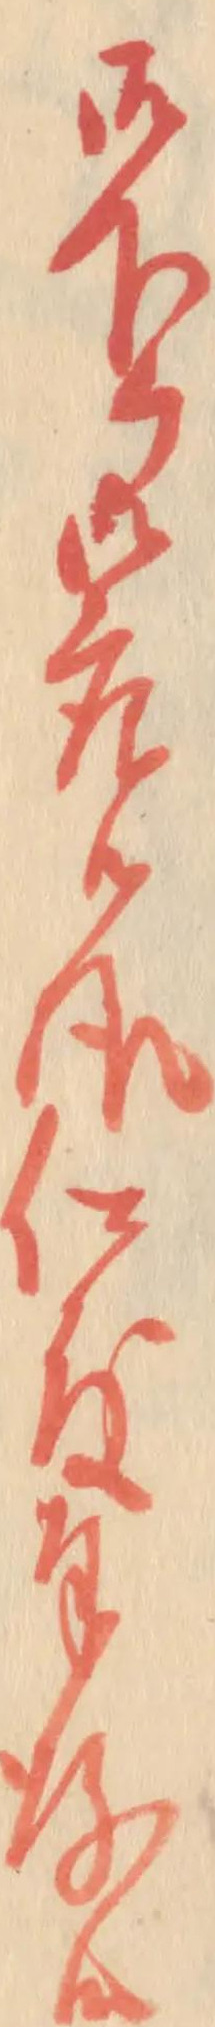御下ケ御座候様仕度奉存候
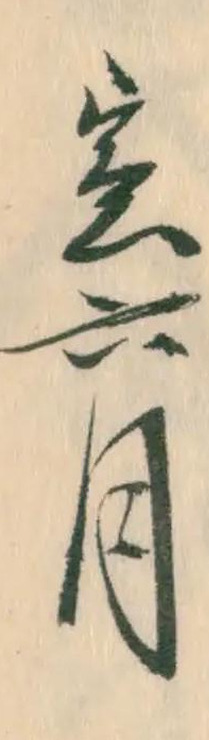寅六月
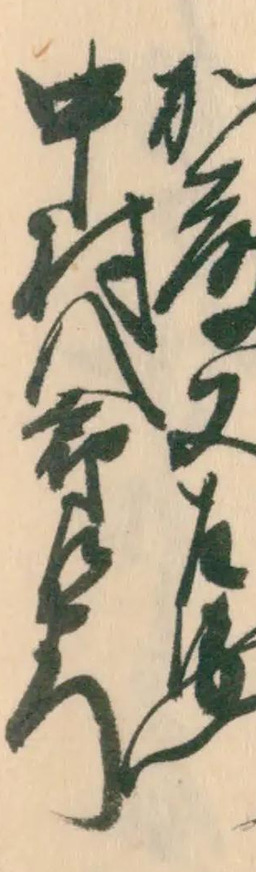中村八郎左衛門
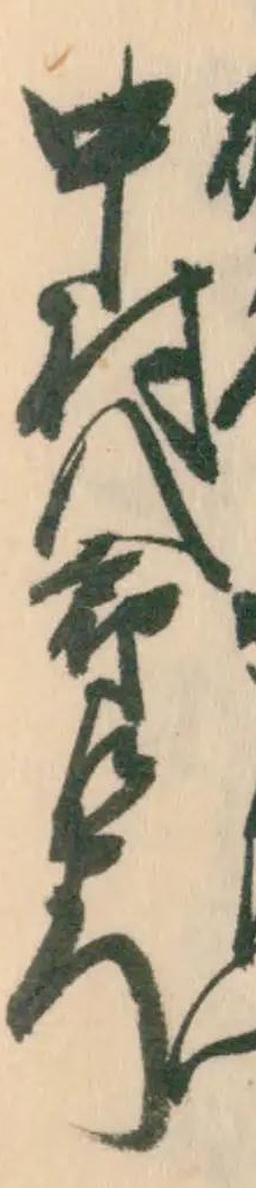中村八郎左衛門
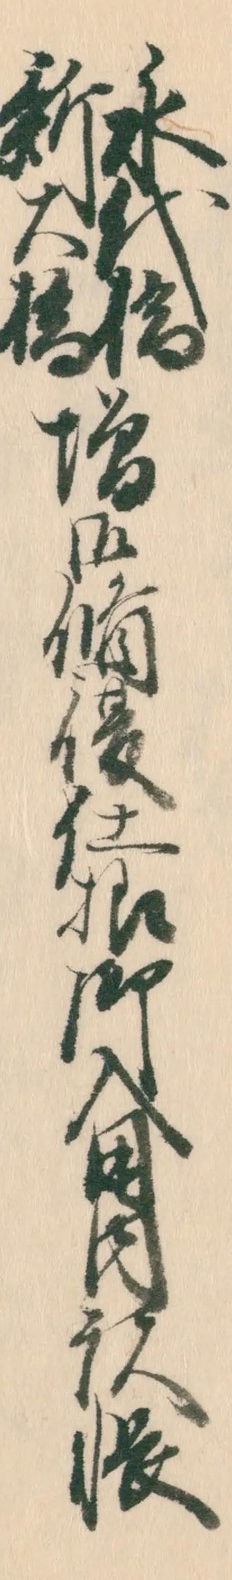新大橋増御修復仕様御入用内訳帳
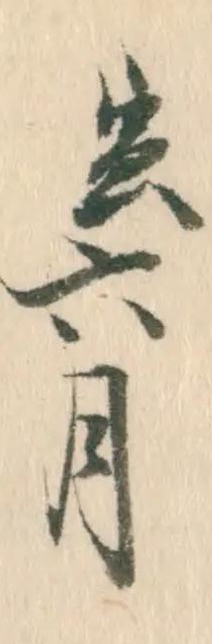寅六月

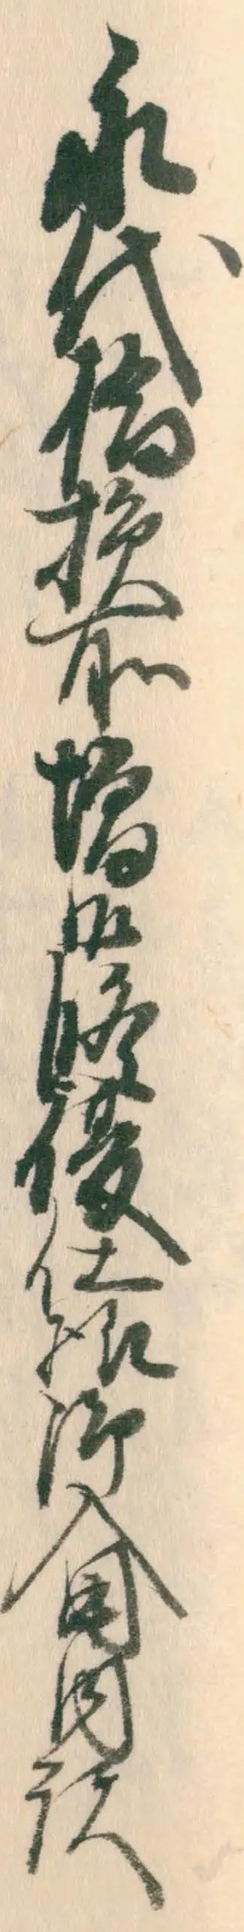永代橋損所増御修復仕様御入用内訳
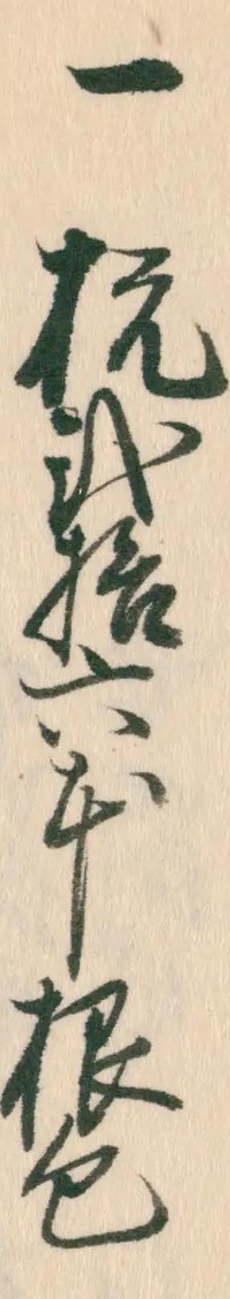一杭弐拾六本根包
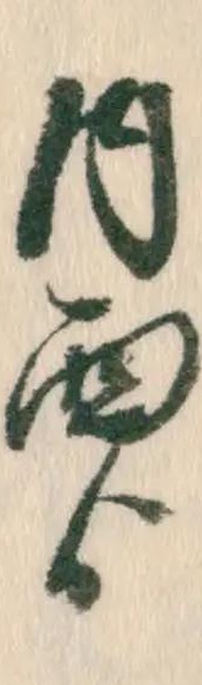内西ゟ
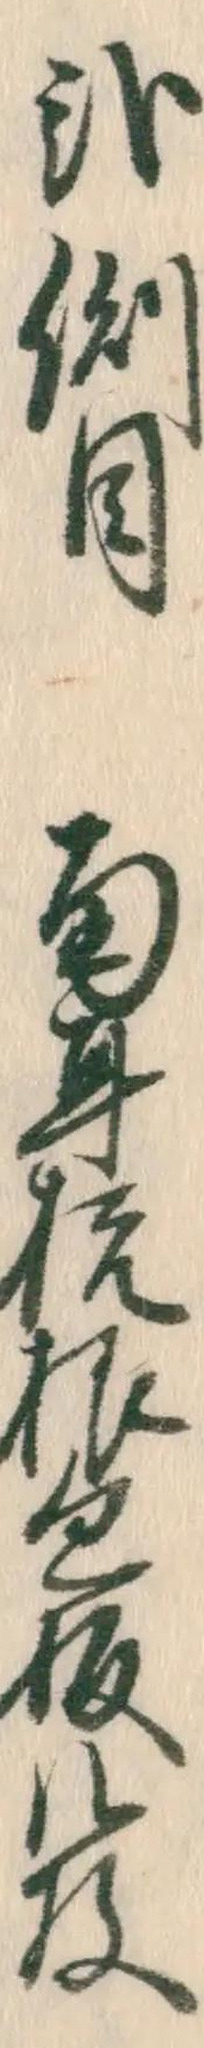弐側目南耳杭根包板八枚
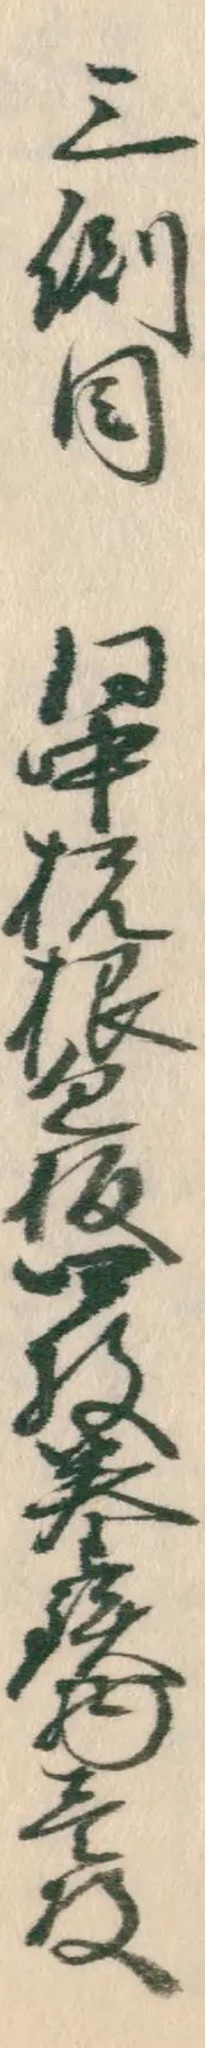三側目同中杭根包板四枚巻鉄物壱枚
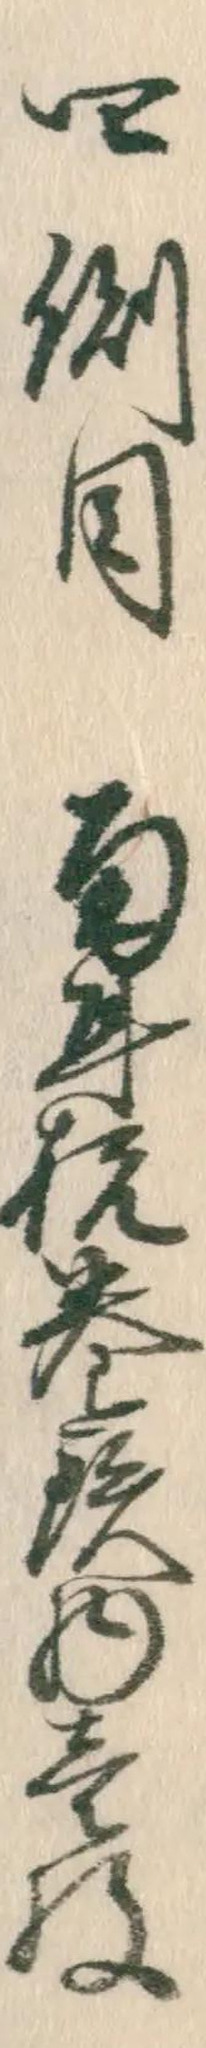四側目南耳杭巻鉄物壱枚
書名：三橋 17巻. [8] 三橋小破御修復書留　但御奉行御掛リ替地震潰橋番屋　嘉永四亥年より安政二卯年迄　下
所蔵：国立国会図書館 National Diet Library, JAPAN
